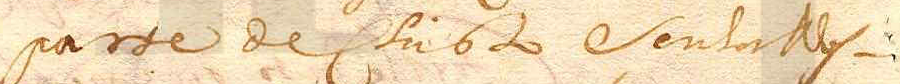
parte de Christo Senhor Nos
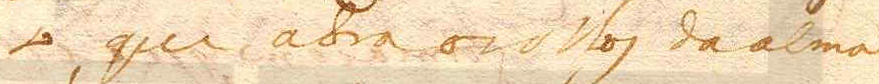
so, que abra os olhos da alma
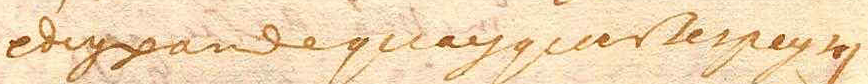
e deyxando quaesquer respeytos
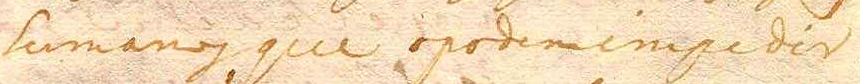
humanos, que o podem impedir
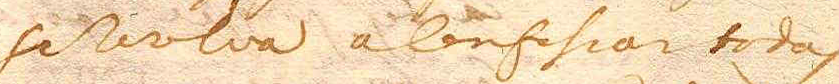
se rezolva a Confessar todas
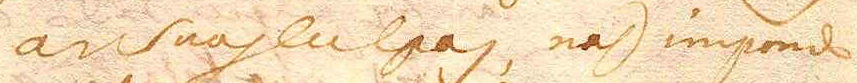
as suas culpas, naõ impondo
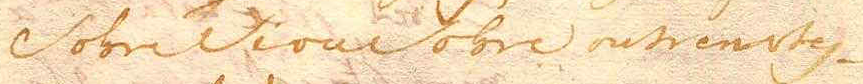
Sobre Si ou Sobre outrem tes
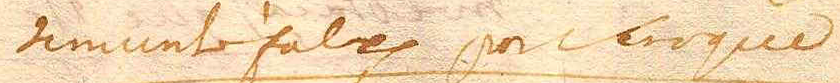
temunho falço por ser o que
